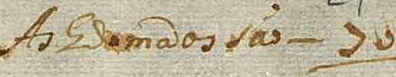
As Edomadas são -70
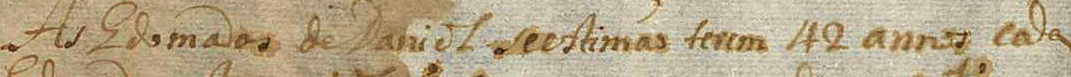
As Edomadas de Daniel se estimão terem 42 annos cada
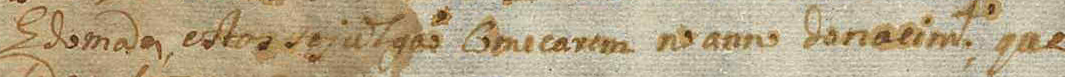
Edomada, estos se julgaõ Comecarem no anno do nacim.to, que
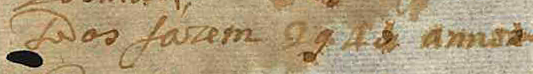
todos fazem 2940, annos
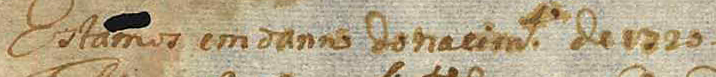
Estamos em o anno do nacim.to de 1720
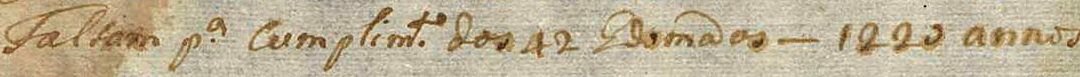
Faltam p.a Cumplim.to dos 42 Edomadas - 1220 annos
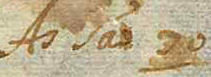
As são 70
